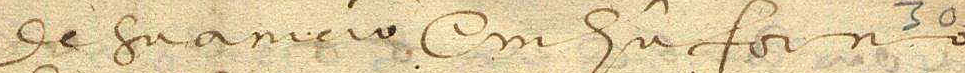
de sua maõ em hū forno
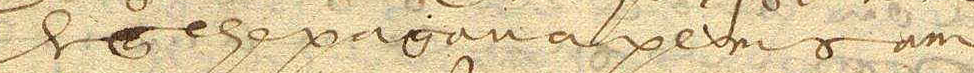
de q̄ lhe pagaua pemsam
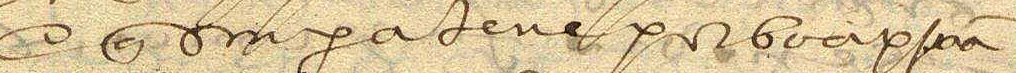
e q̄ senꝑ a teue por boa xpaā
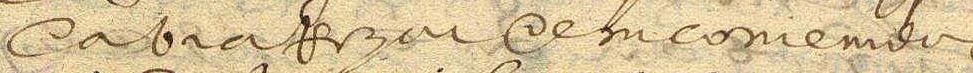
e a via Rezar e emcomemdar
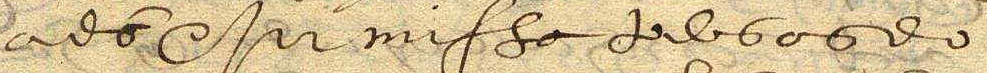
a ds̄ e Jir missa todos os do
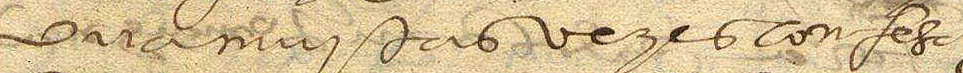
vira mujtas vezes confesar
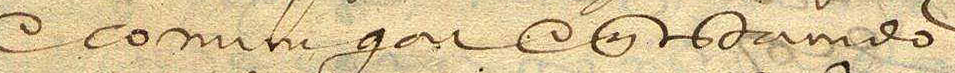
e comungar e q̄ estamdo
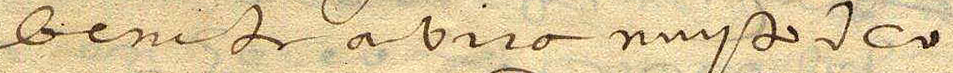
doemte a vira mujto ēco
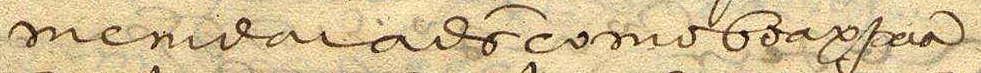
memdar a ds̄ como boa xpaā
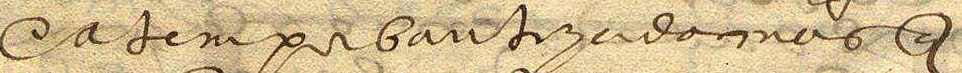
e a tem por bautizada mas q̄
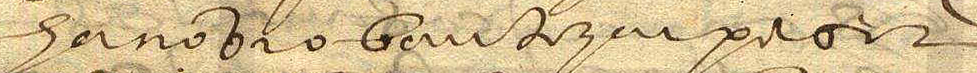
ha nō vio bautizar por ser
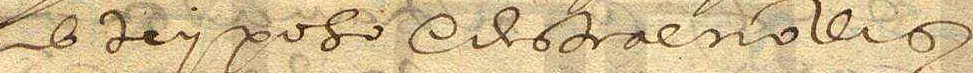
do teyxoso e deste al nō disj
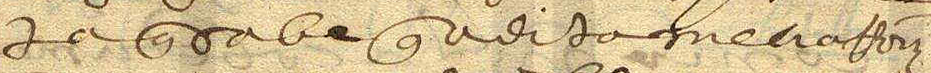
ta q̄ sabe q̄ a dita mecia Roiz̄
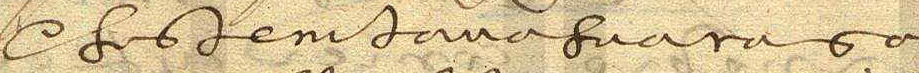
e sostemtaua sua casa
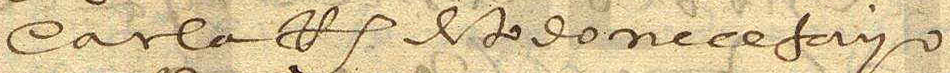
e a ela Rꝭ de todo necesarjo
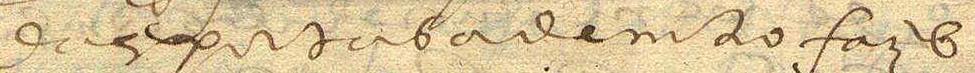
das portas ademtro faz̄do
